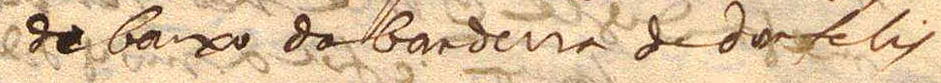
debaixo da bandeira de dom felis
